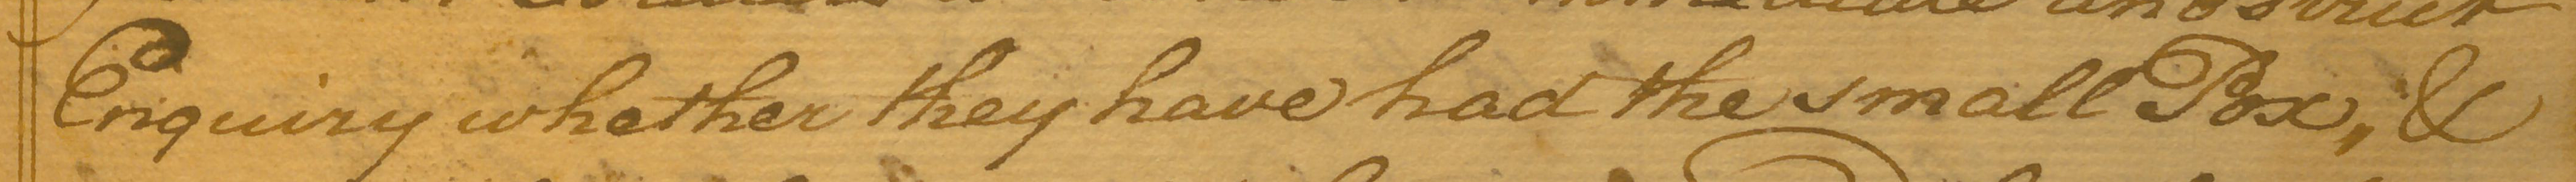Enquiry whether they have had the small Pox, &
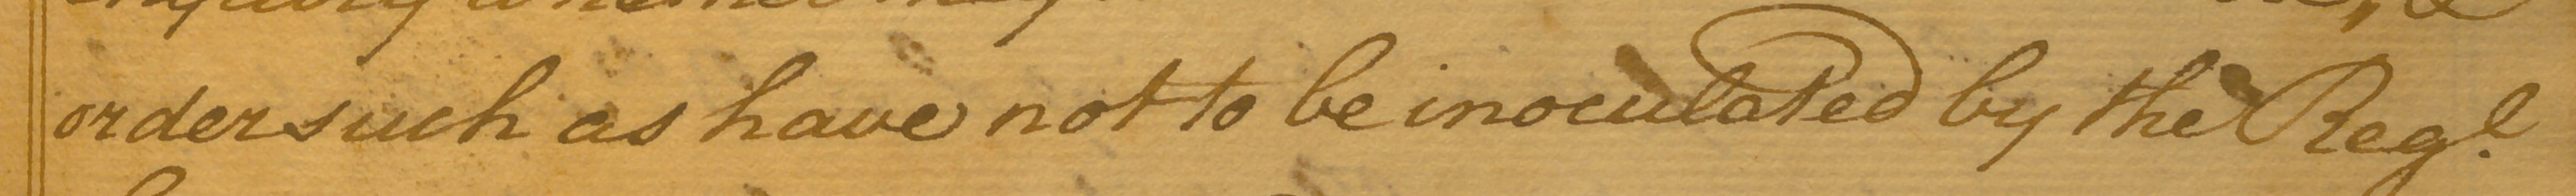order such as have not to be inoculated by the Reg^l.
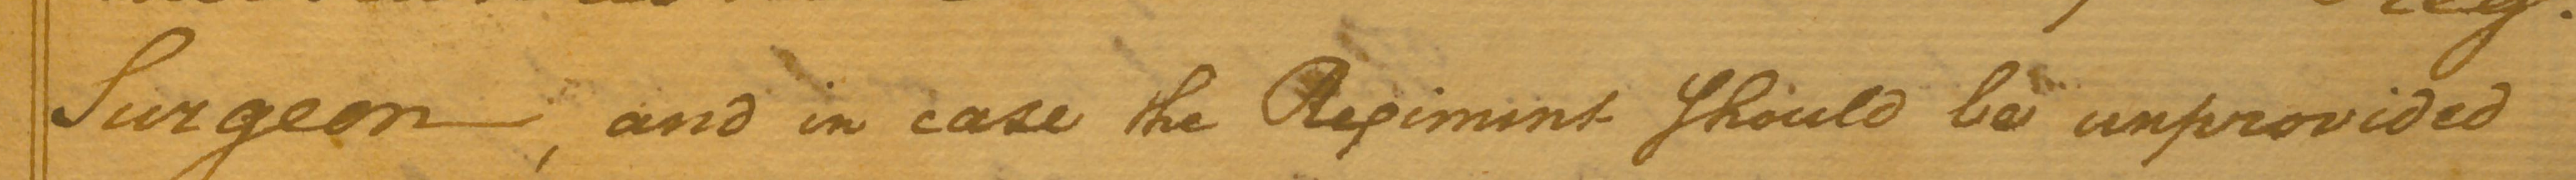Surgeon, and in case the Regiment should be unprovided
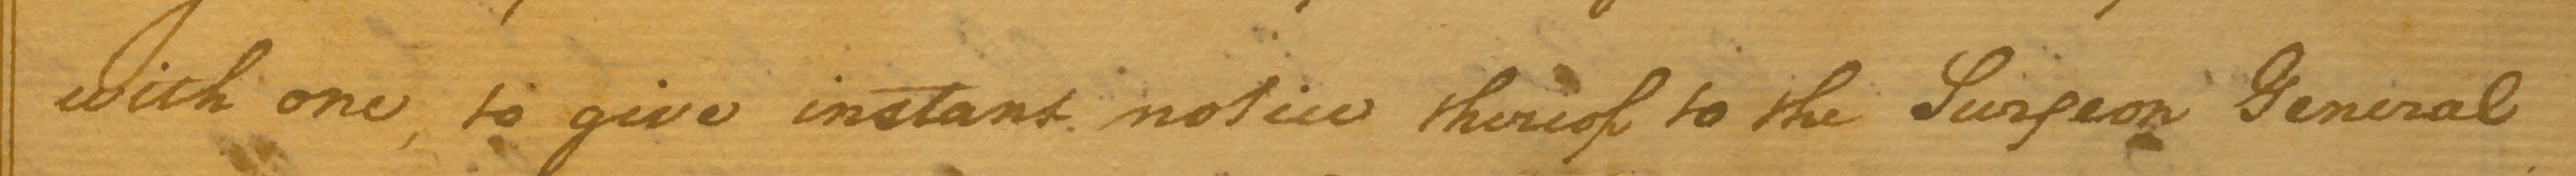with one, to give instant notice thereof to the Surgeon General
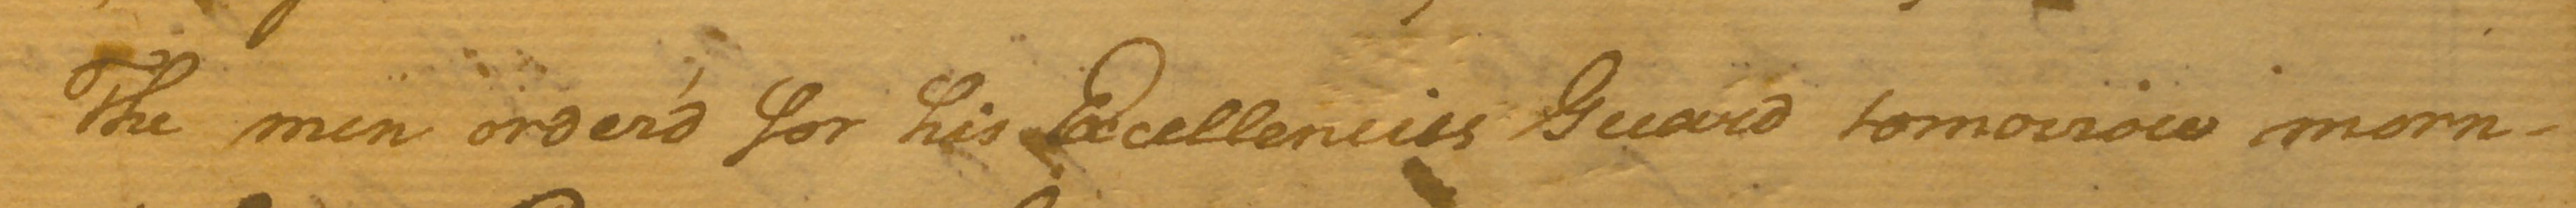The men order'd for his Excellencies Guard tomorrow morn-
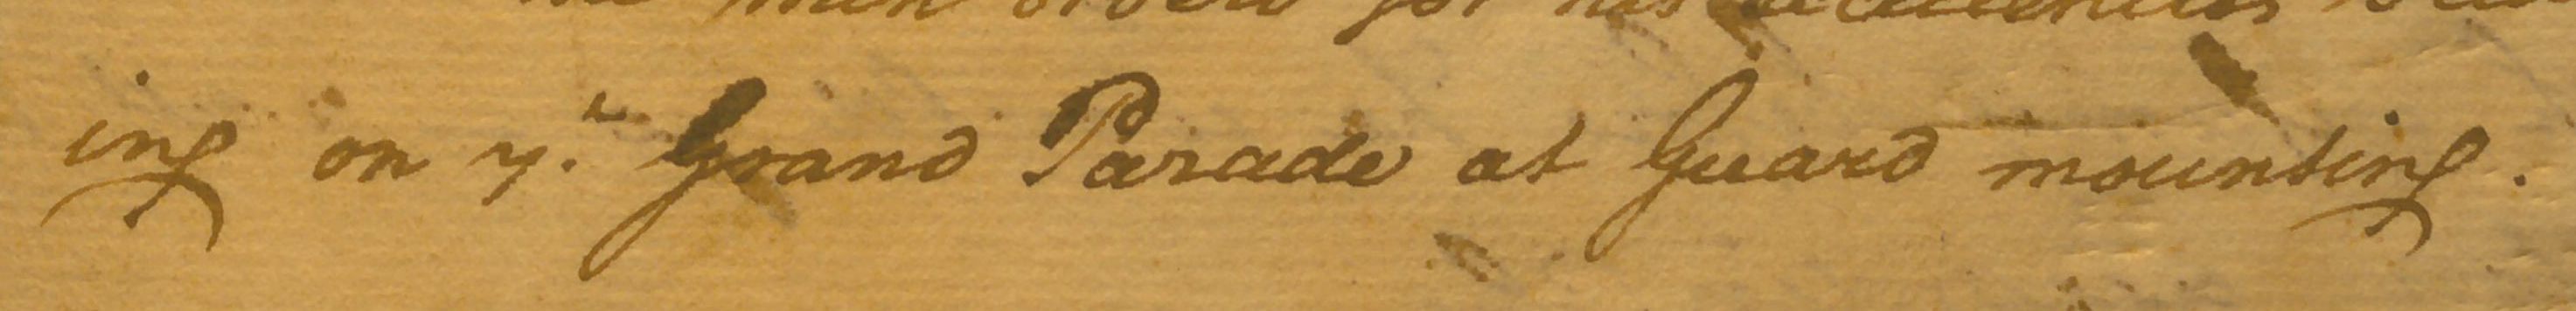ing on y^e. Grand Parade at Guard mounting.
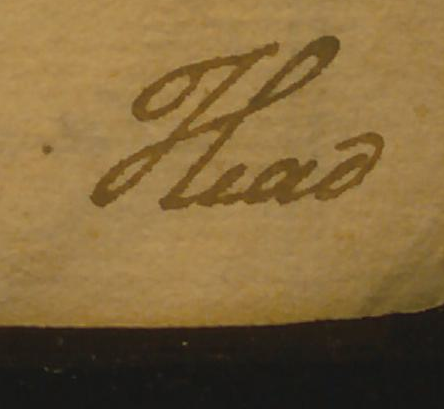Head
